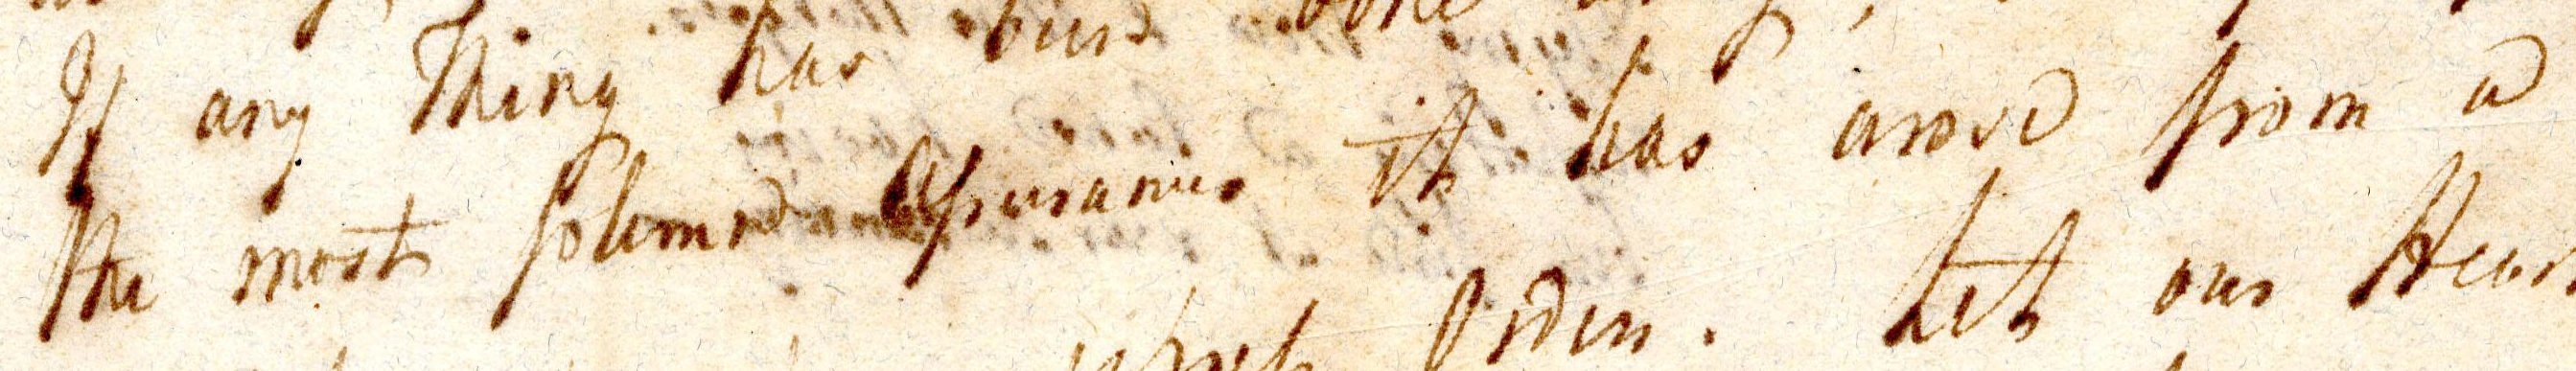the most Solemn Assurances it has arose from a
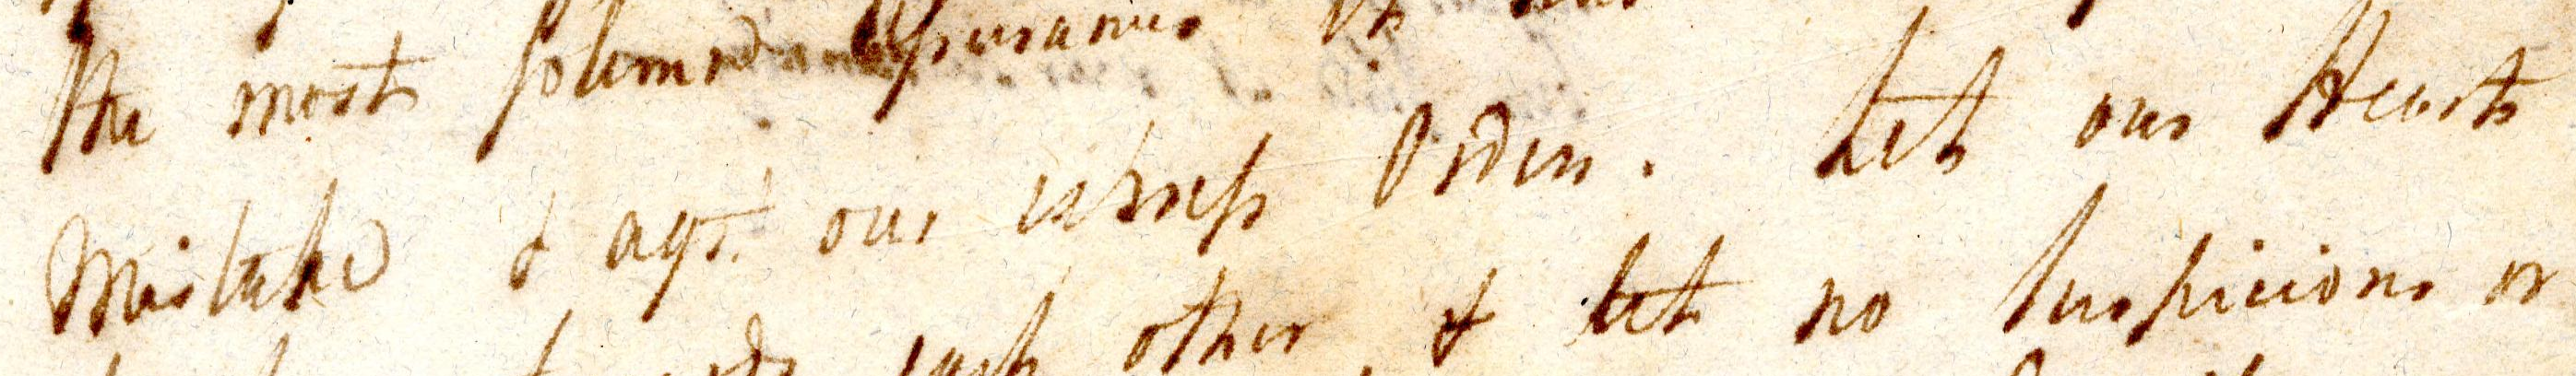Mistake & agst our express Orders. Let our Hearts
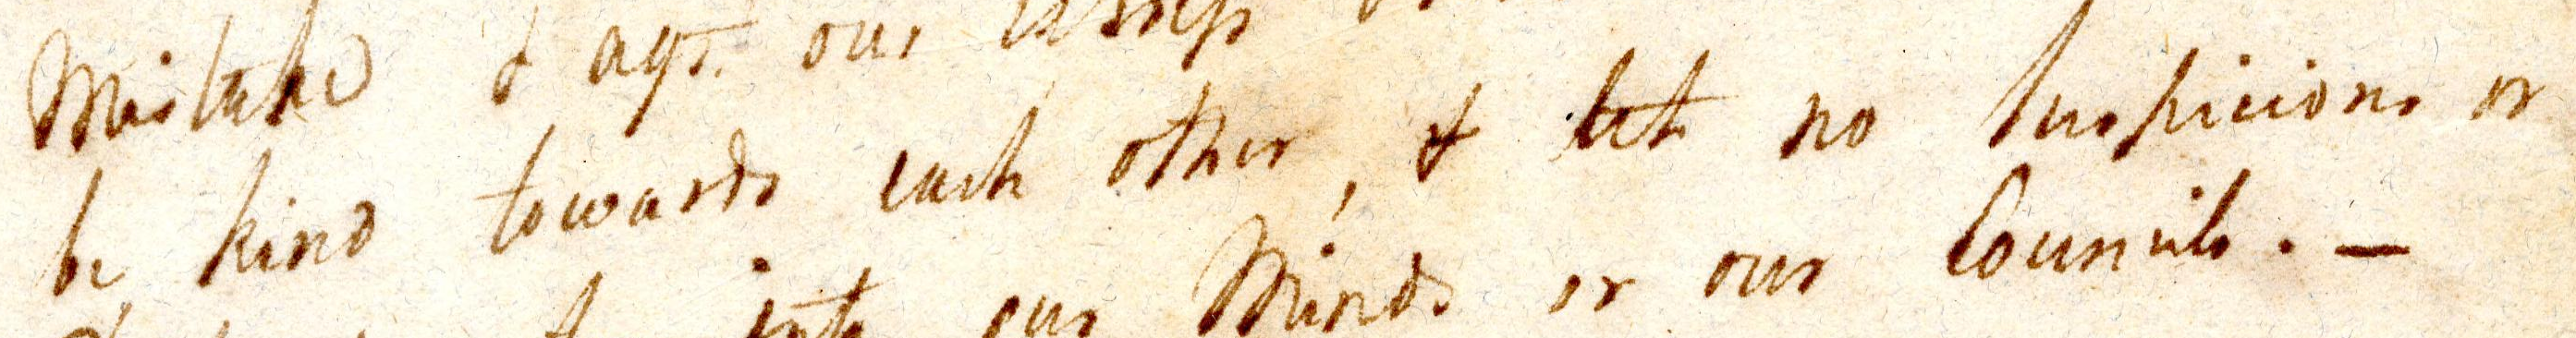be kind towards each other, & let no Suspicions or
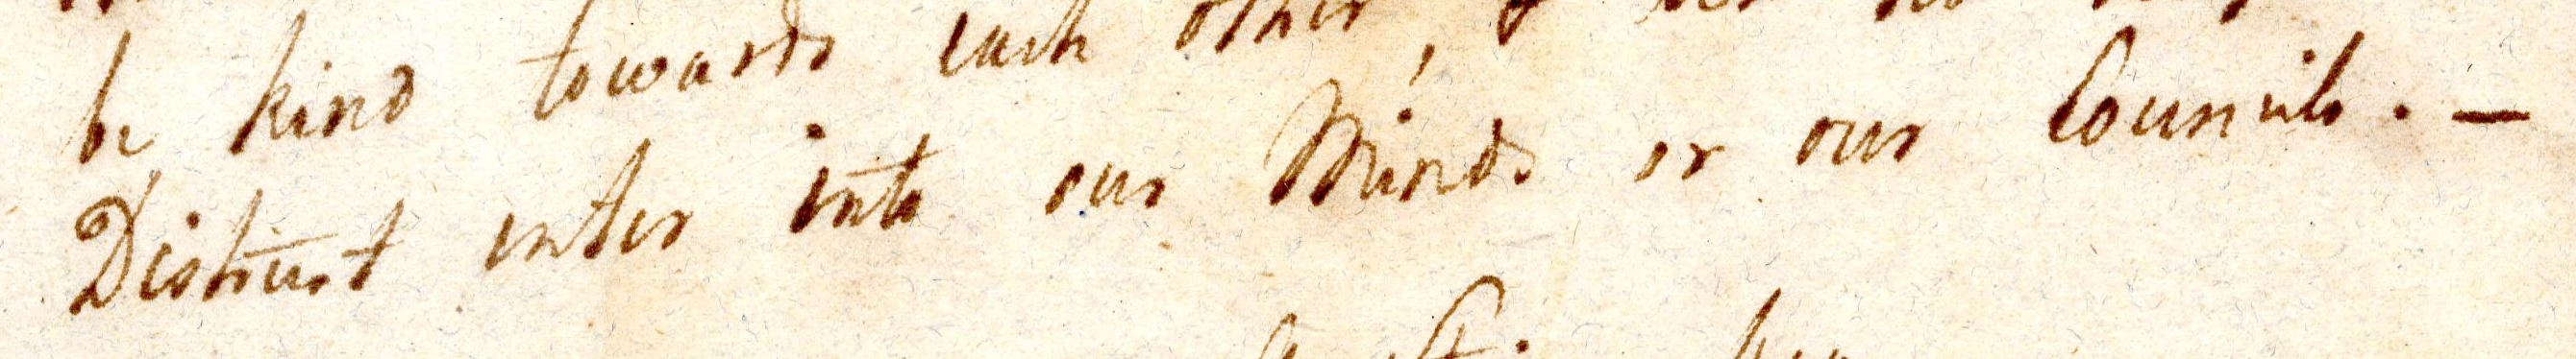Distrust enter into our Minds or our Councils.-
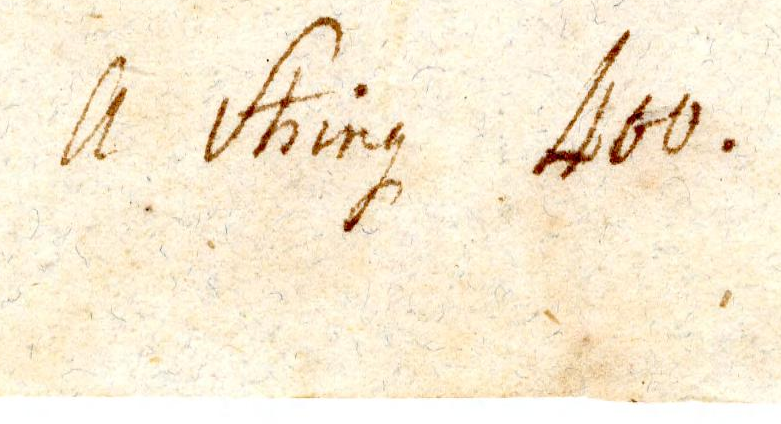A String 400.
